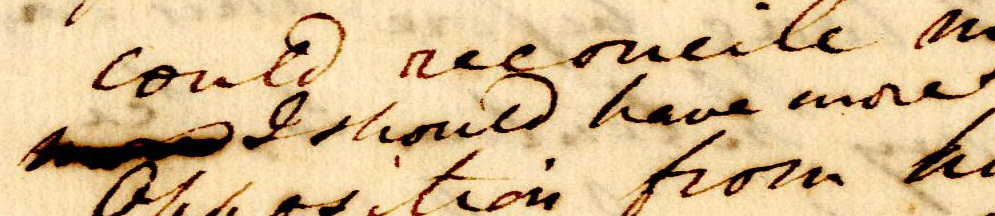[more] I should have more
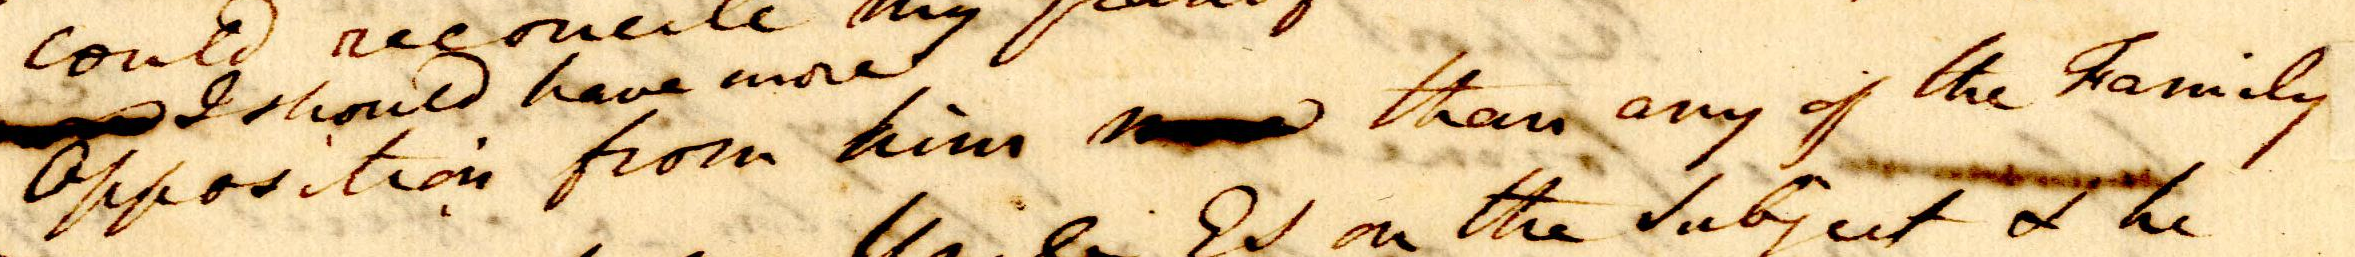Opposition from him more than any of the Family
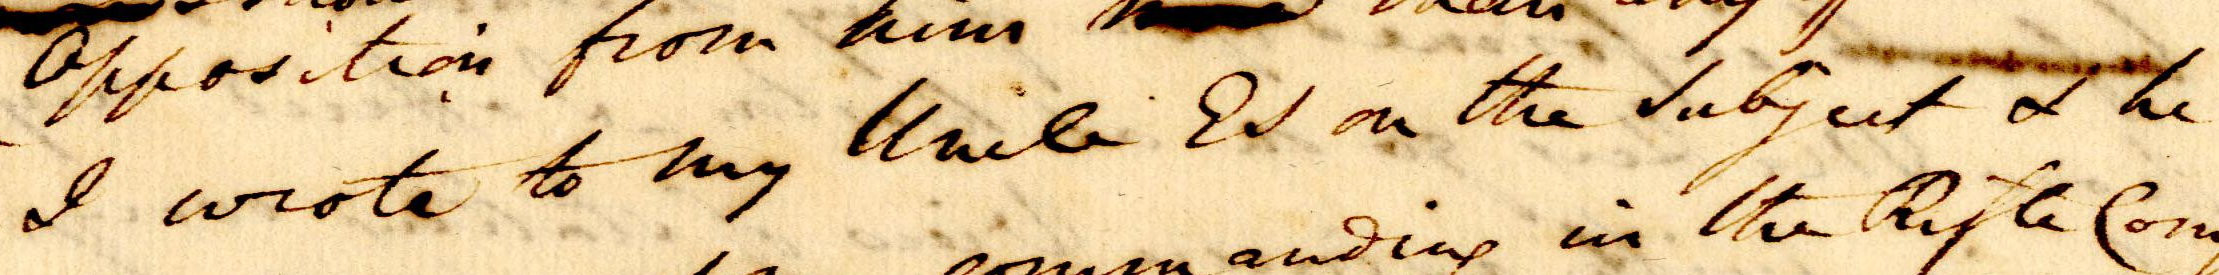I wrote to my Uncle Ed on the Subject & he
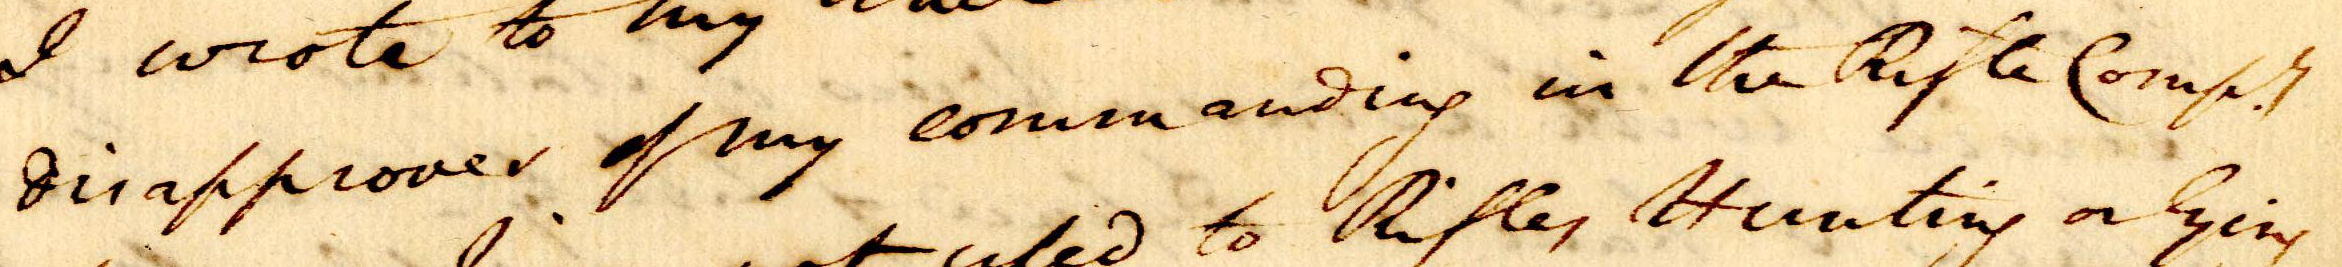disapproves of my commanding in the People Comp.
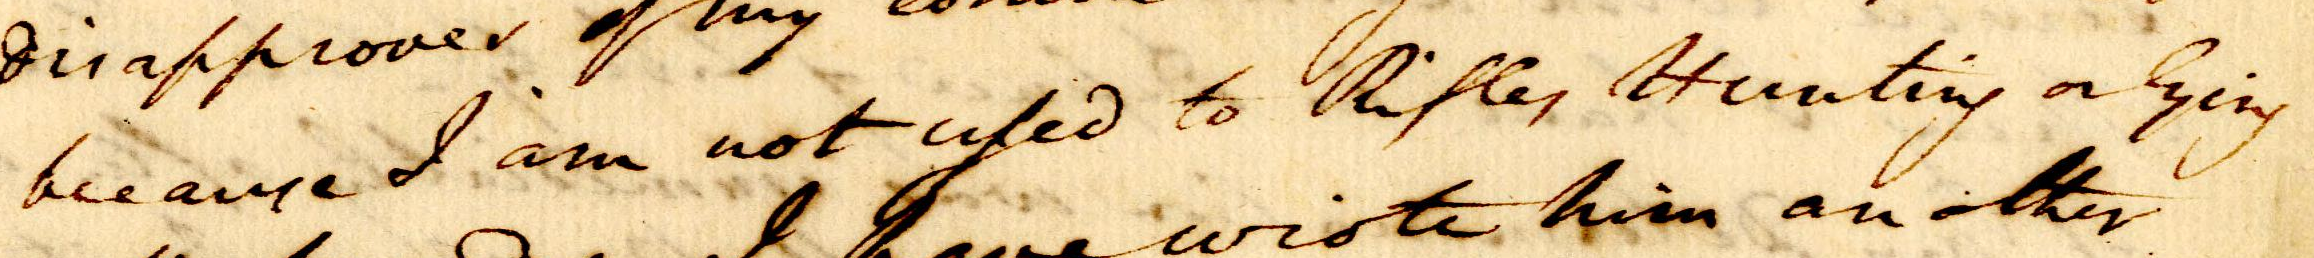because I am not used to Rifles Hunting or lying
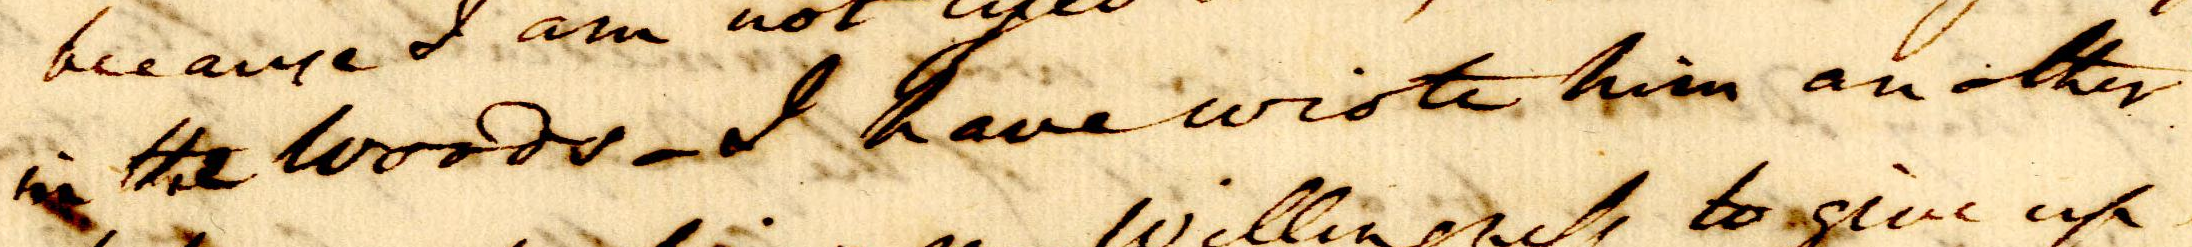in the Woods. I have wrote him an other
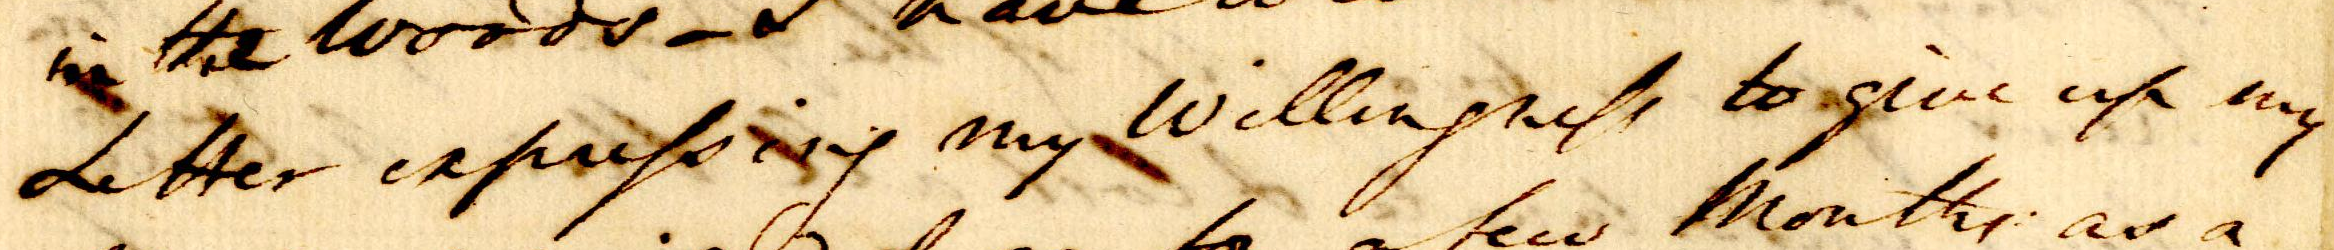Letter expressing my Willingness to give up my
